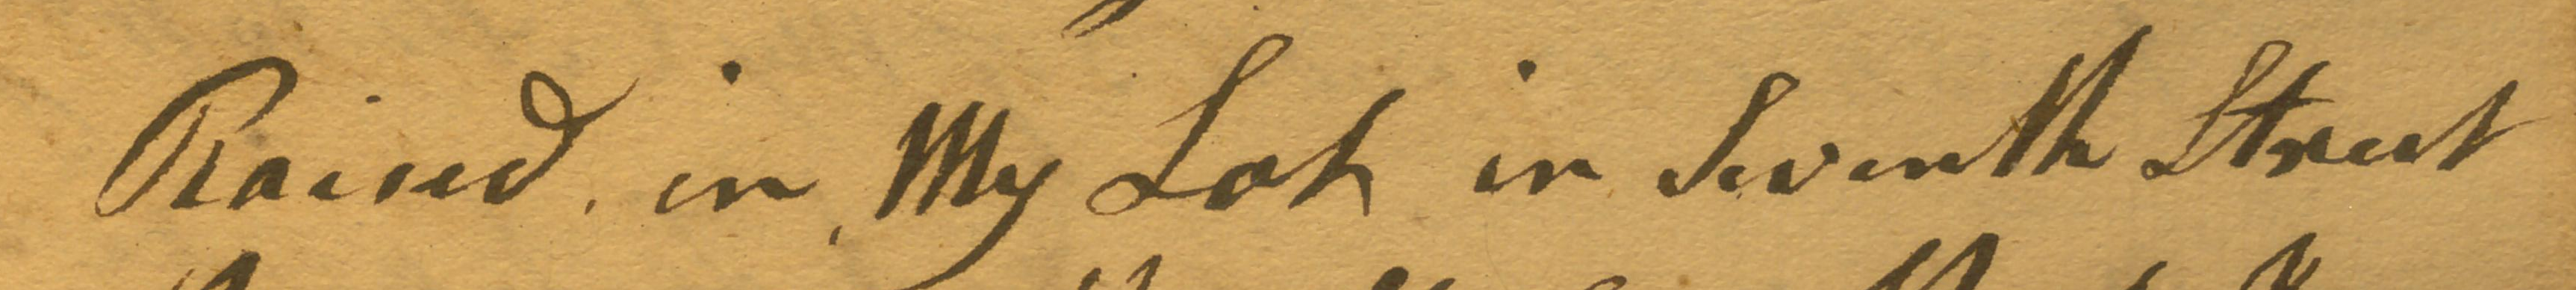Raised. in My Lot in Seventh Street
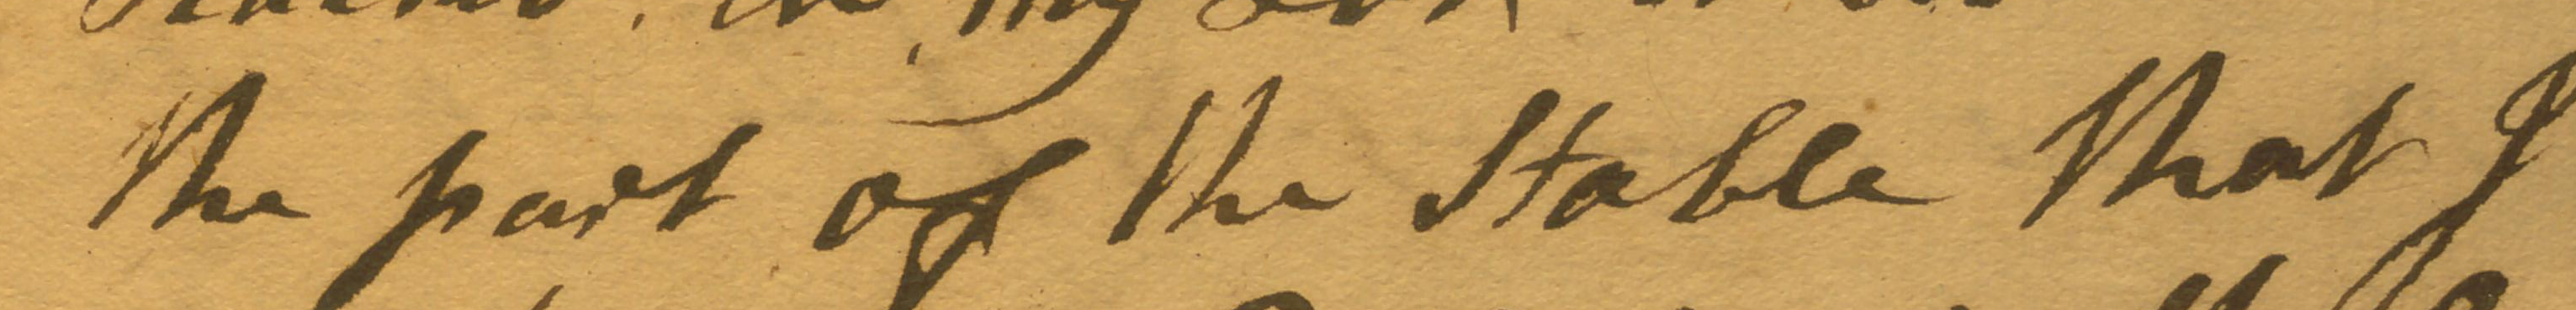the part of the Stable that I
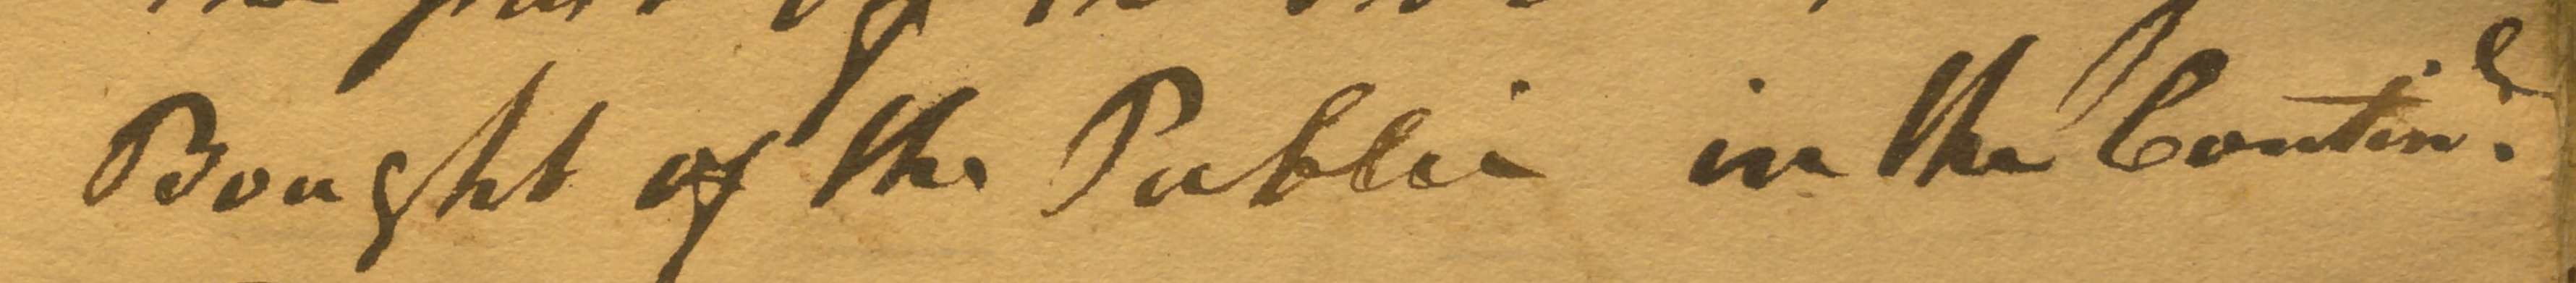Bought of the Public in the Contin^l.
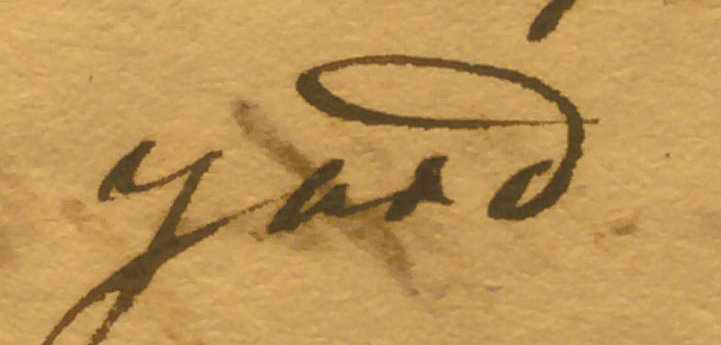yard
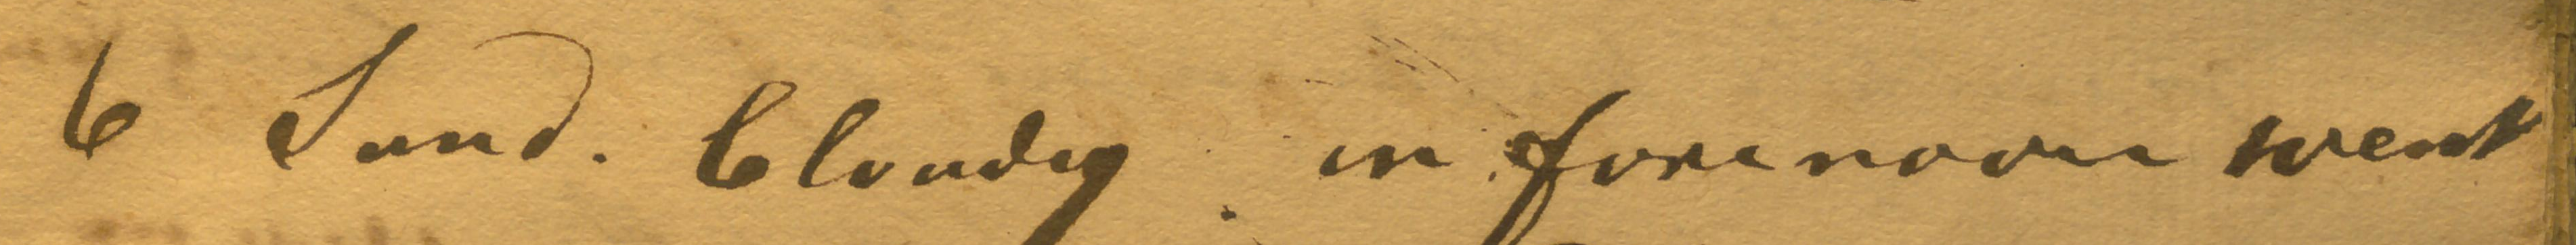6 Sund. Cloudy in forenoon went
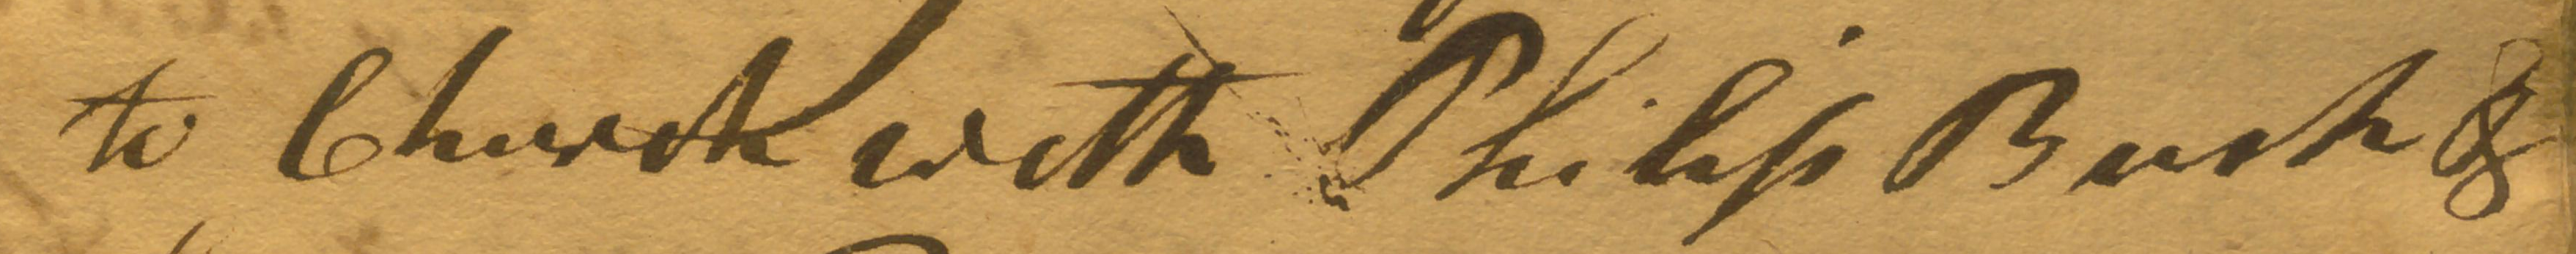to Church with Philip Bush &
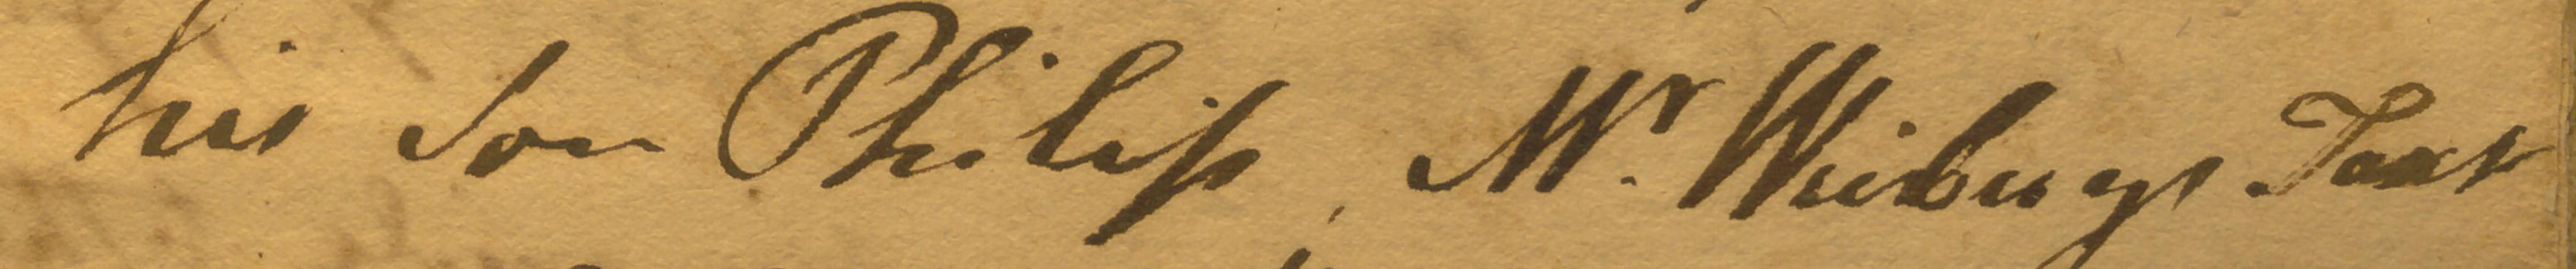his Son Philip M^r. Weibesgs Text
